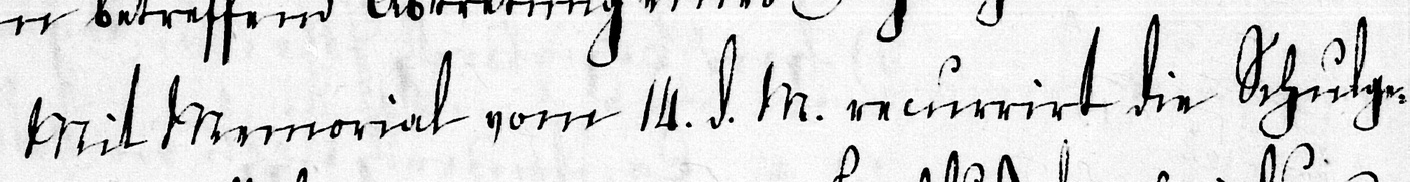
Mit Memorial vom 14. d. M. recurrirt die Schulge¬
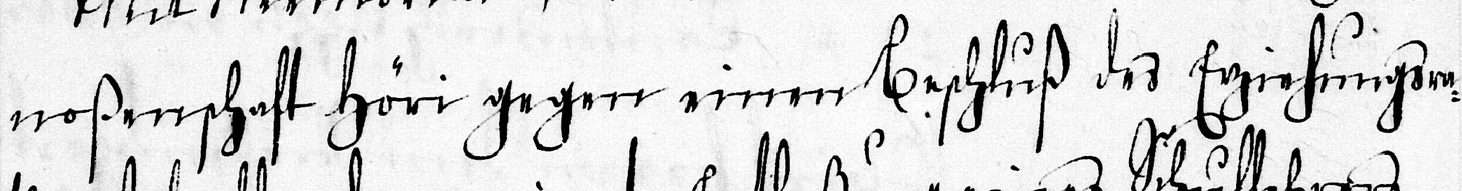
noßenschaft Höri gegen einen Beschluß des Erziehungsr¬
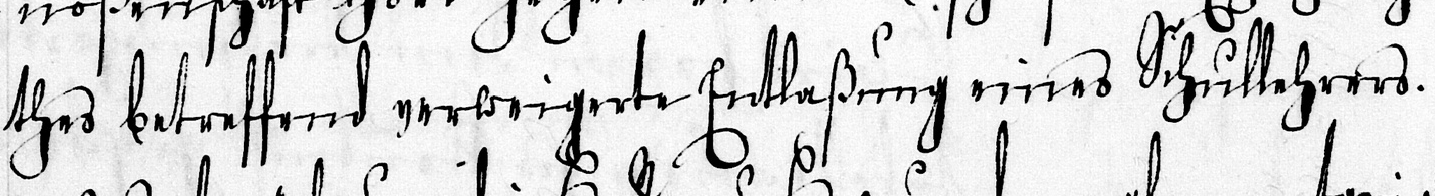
athes betreffend verweigerte Entlaßung eines Schullehrers.
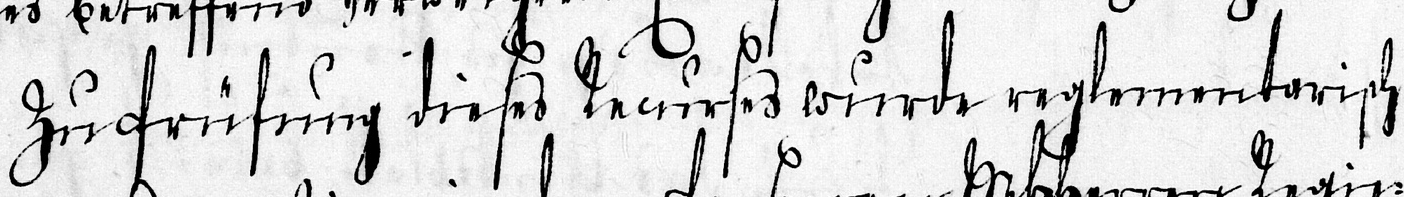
Zu Prüfung dieses Recurses wurde reglementarisch
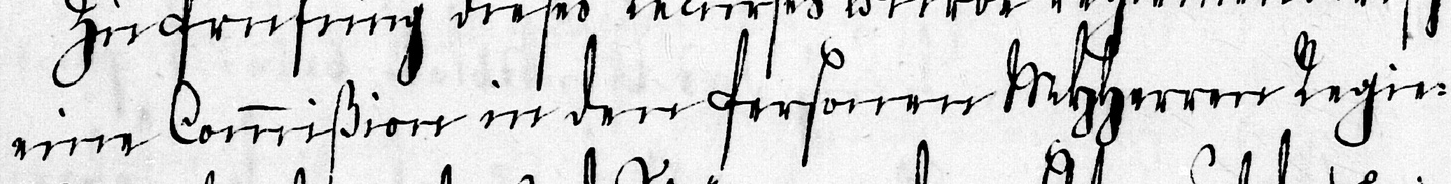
eine Commißion in den Personen MHHerren Regie¬
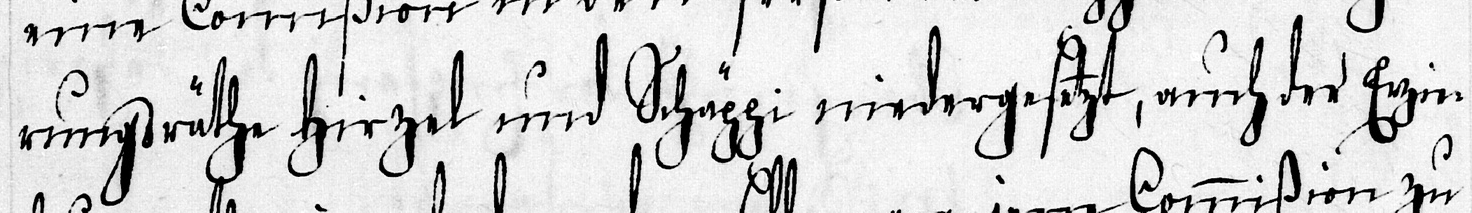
rungsräthe Hirzel und Schäppi niedergesetzt, auch der Erzi¬
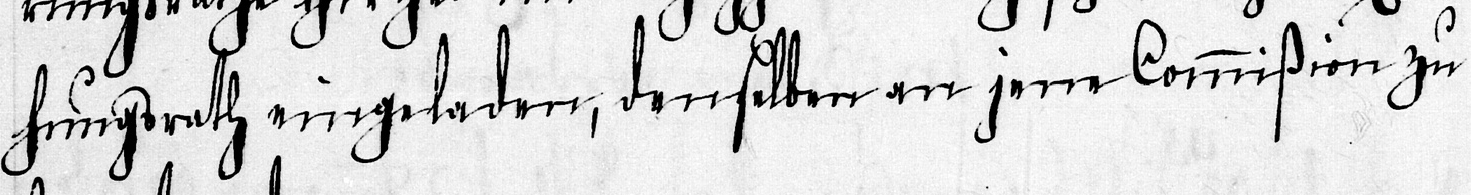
ehungsrath eingeladen, denselben an jene Commißion zu
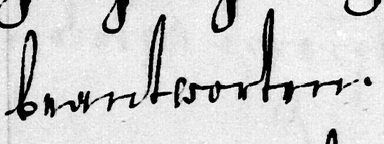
beantworten.
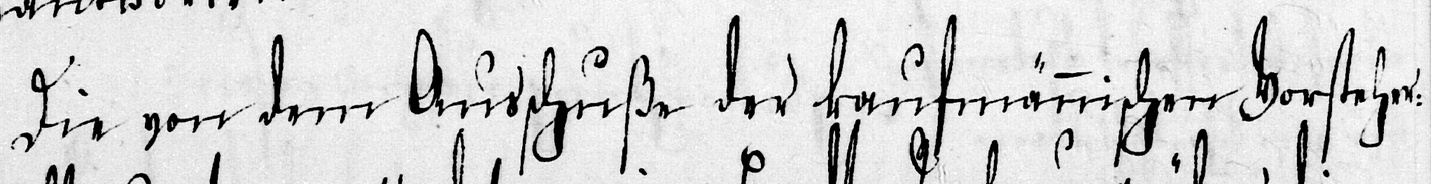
Die von dem Ausschuße der kaufmännischen Vorsteh¬
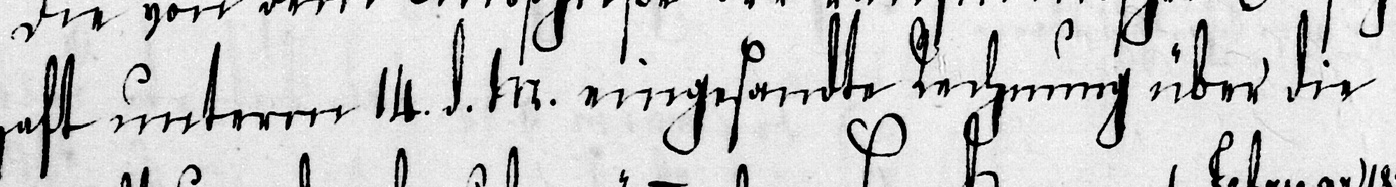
haft unterm 14. d. M. eingesandte Rechnung über die
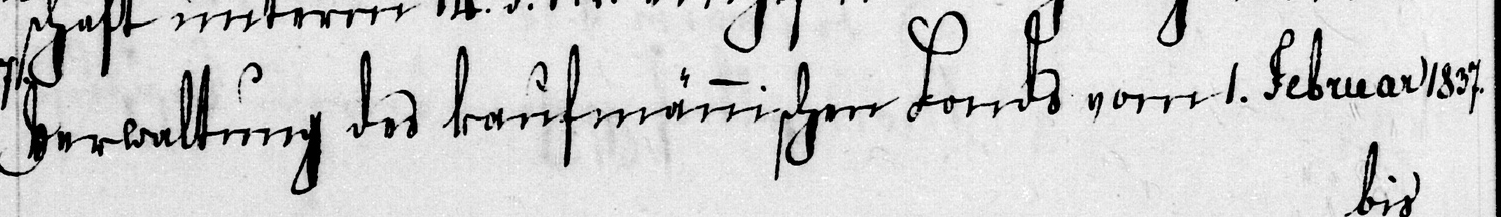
Verwaltung des kaufmännischen Fonds vom 1. Februar 1837.
